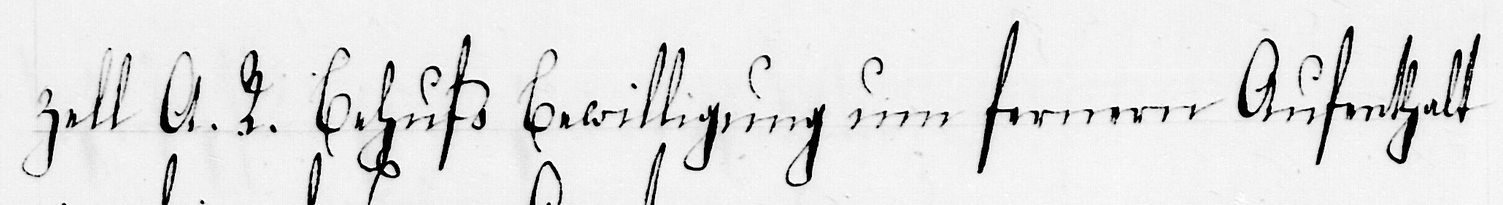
zell A. R. Behufs Bewilligung um fernern Aufenthalt
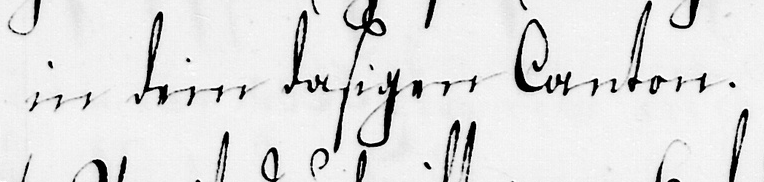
in dem dasigen Canton.
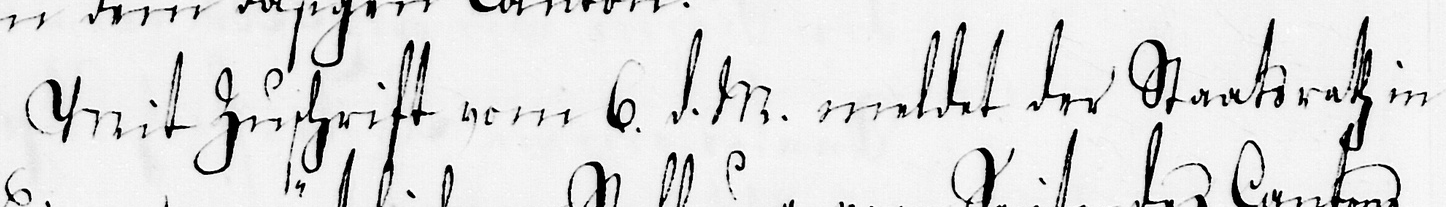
Mit Zuschrift vom 6. d. M. meldet der Staatsrath in
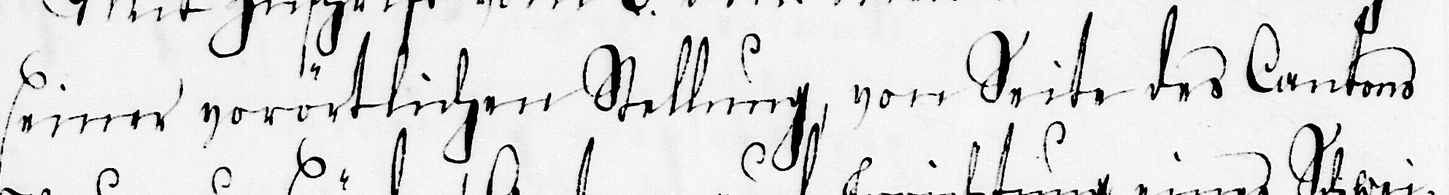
seiner vorörtlichen Stellung, von Seite des Cantons
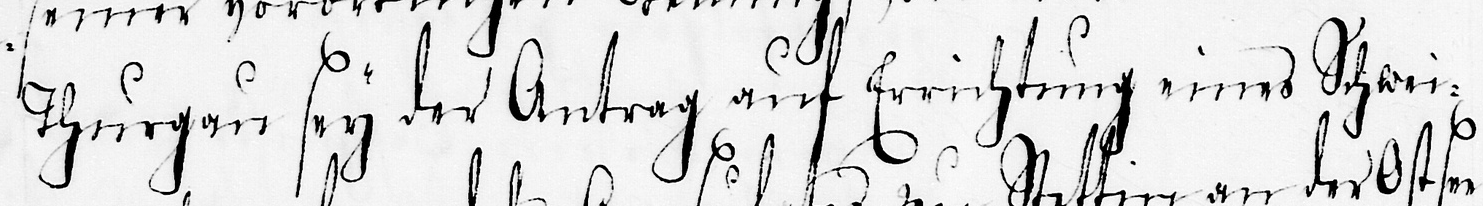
Thurgau sey der Antrag auf Errichtung eines Schwei¬
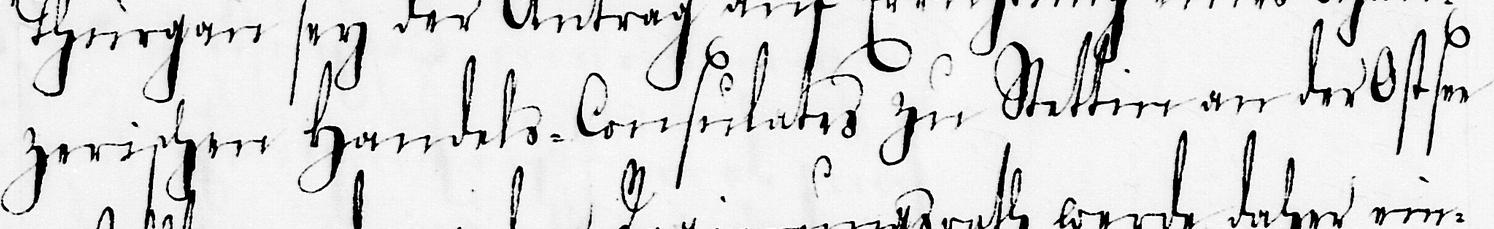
zerischen Handels-Consulates zu Stettin an der Ostse¬
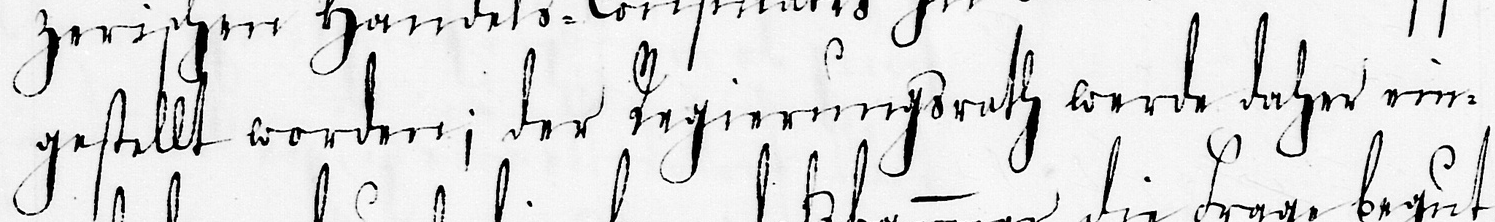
gestellt worden; der Regierungsrath werde daher ein¬
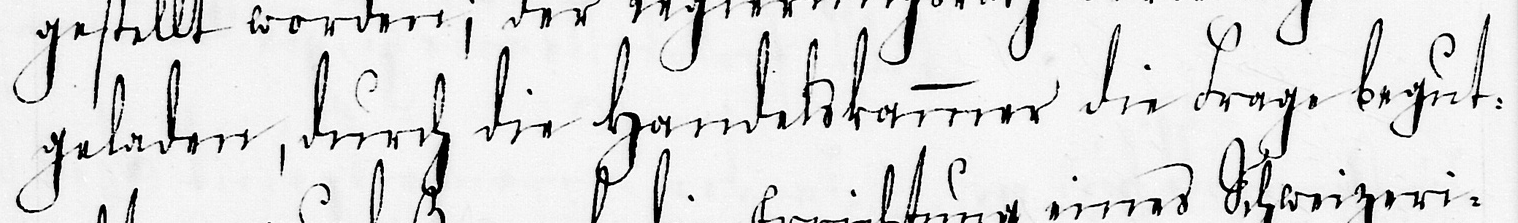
geladen, durch die Handelskammer die Frage begut¬
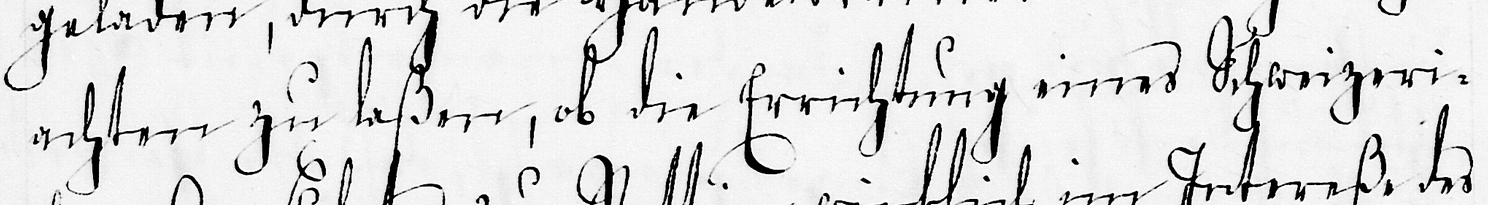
achten zu laßen, ob die Errichtung eines Schweizeri¬
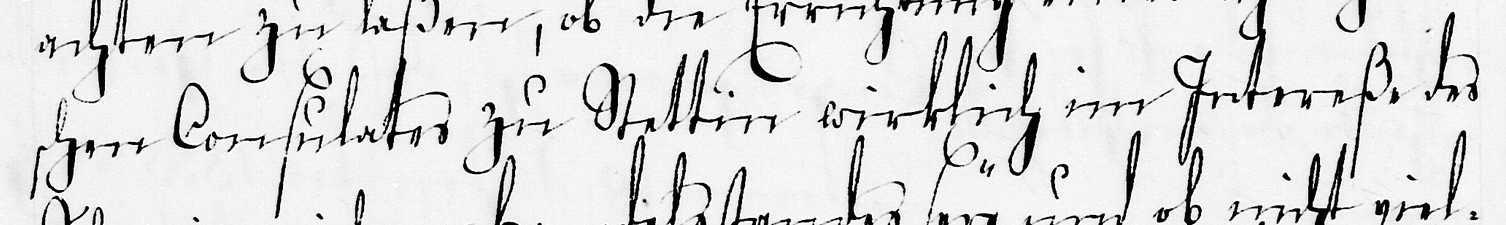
schen Consulates zu Stettin wirklich im Intereße des
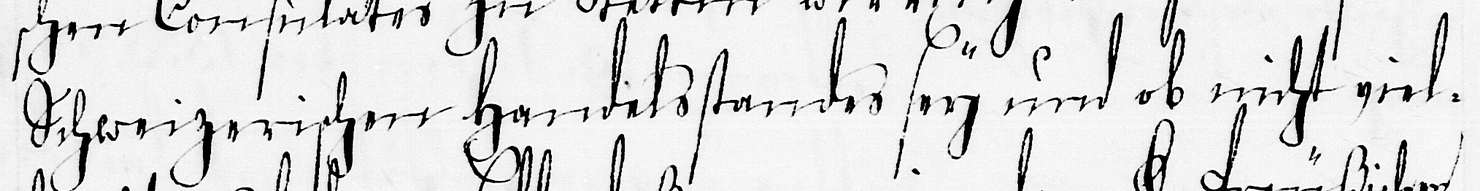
Schweizerischen Handelsstandes sey und ob nicht viel¬
